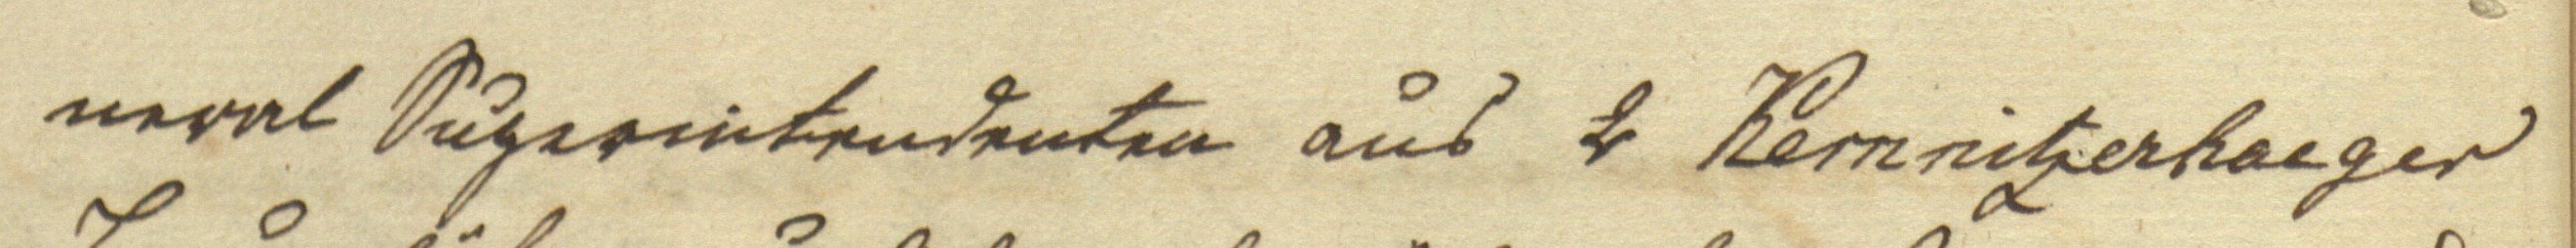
neral Superintendenten aus 2 Kemnitzerhaeger
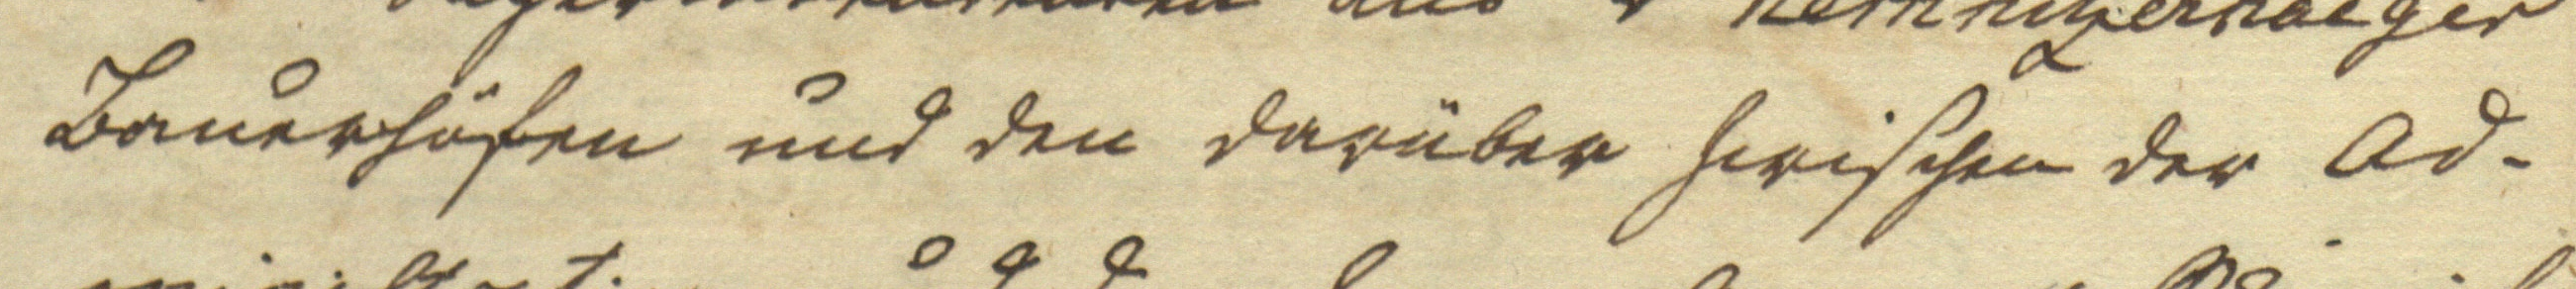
Bauerhöfen und den darüber zwischen der Ad¬
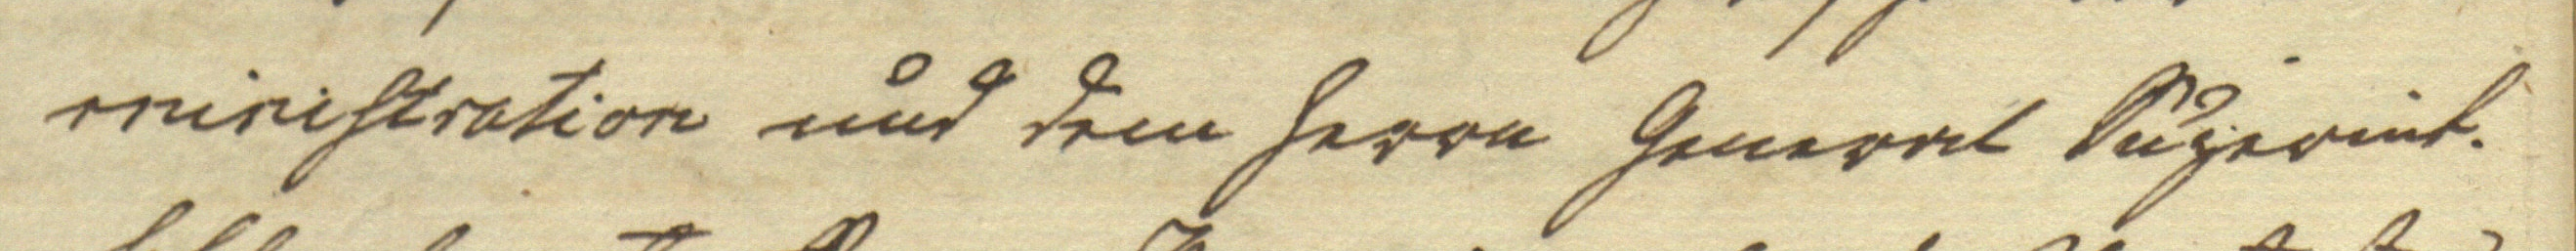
ministration und dem Herrn General Superint.
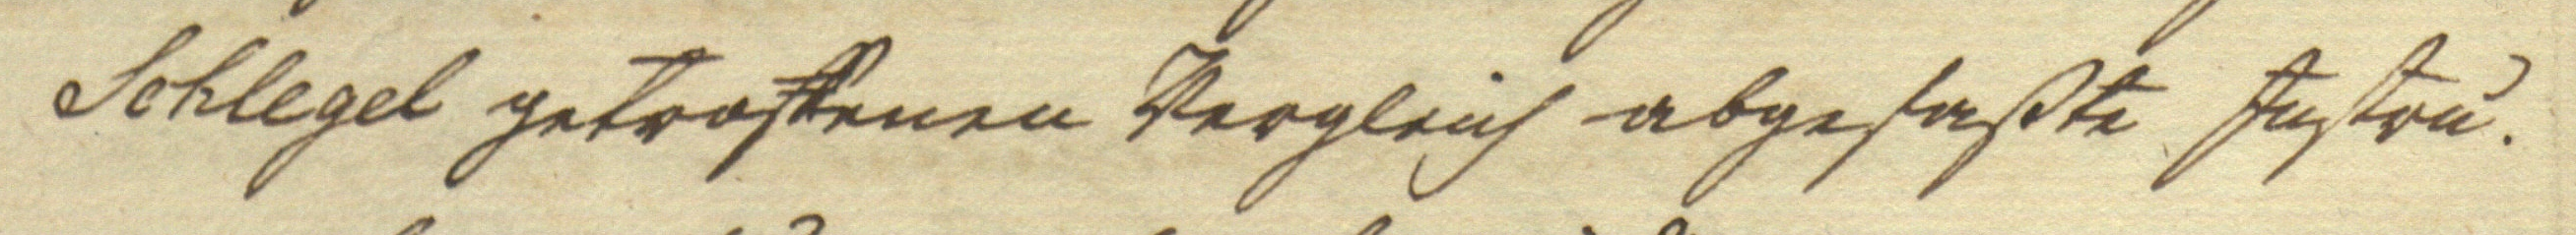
Schlegel getroffenen Vergleich abgefaßte Instru¬
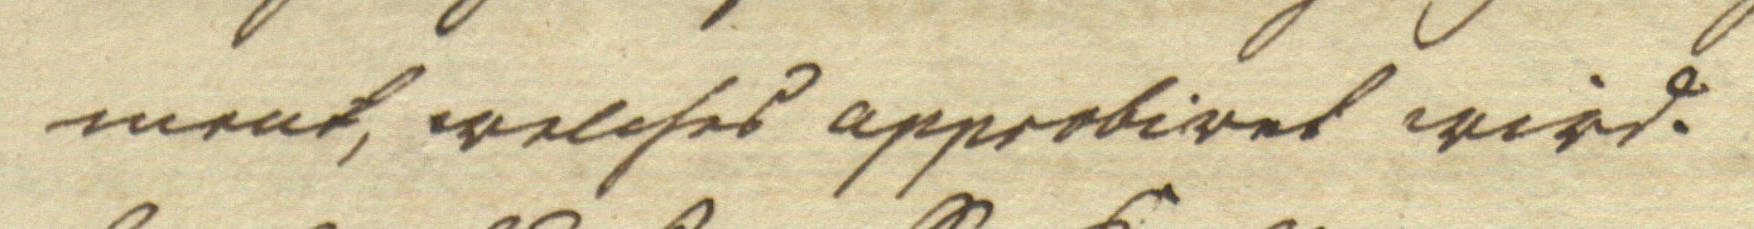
ment, welches approbiret wird.
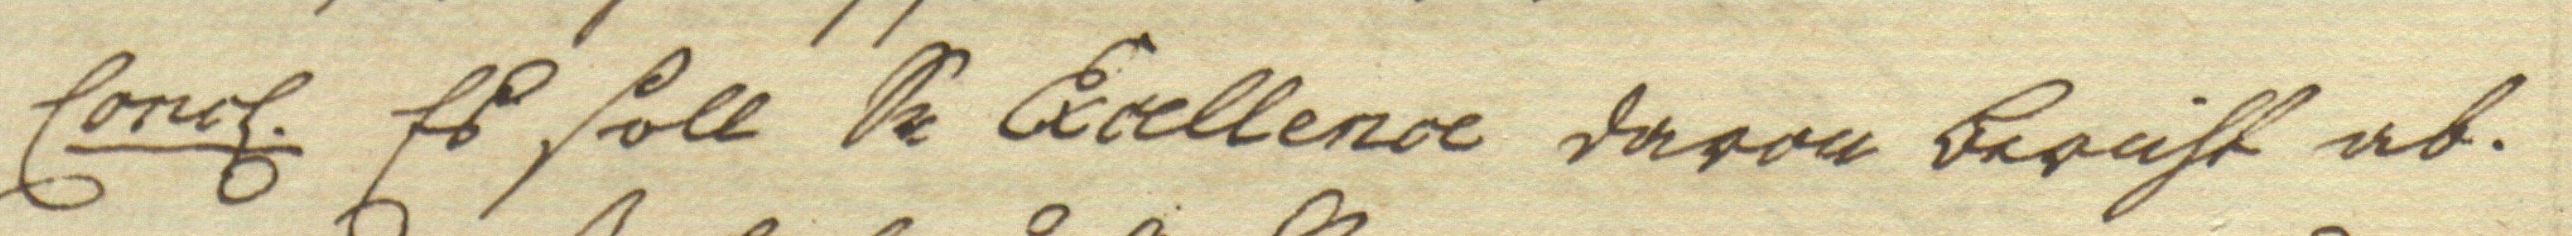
Concl. Es soll Sr Excellence davon Bericht ab¬
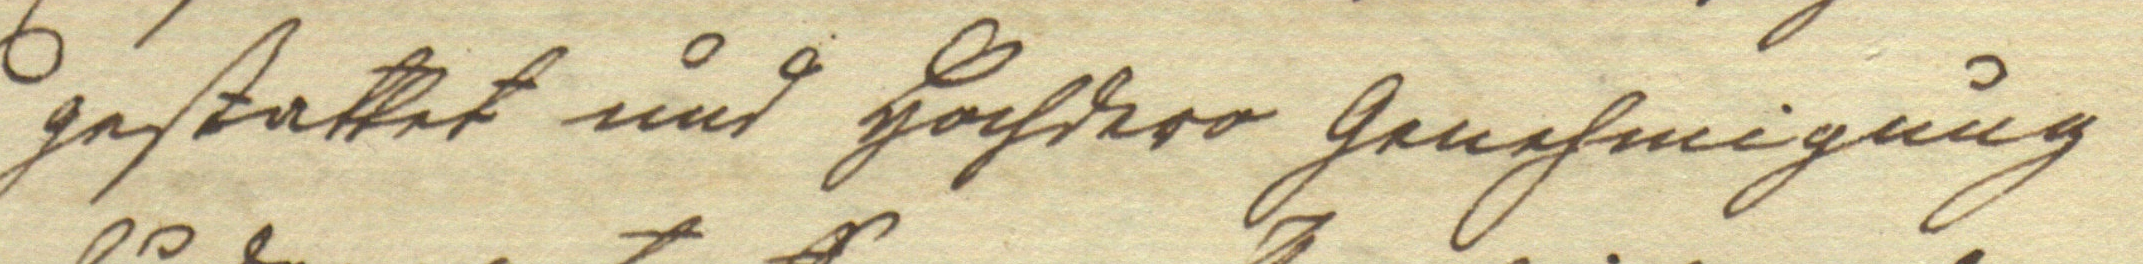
gestattet und Hochdero Genehmigung
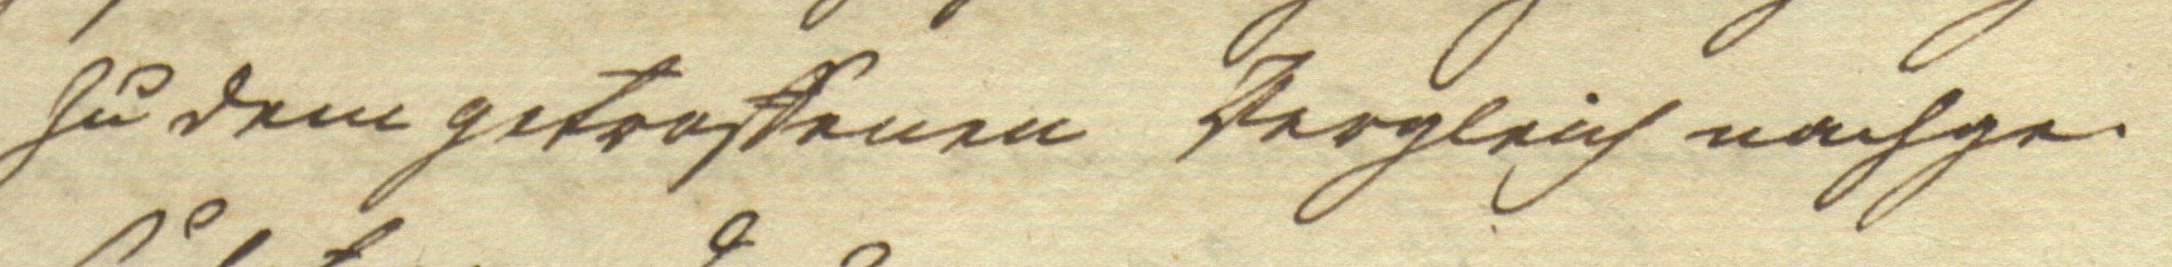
zu dem getroffenen Vergleich nachge¬
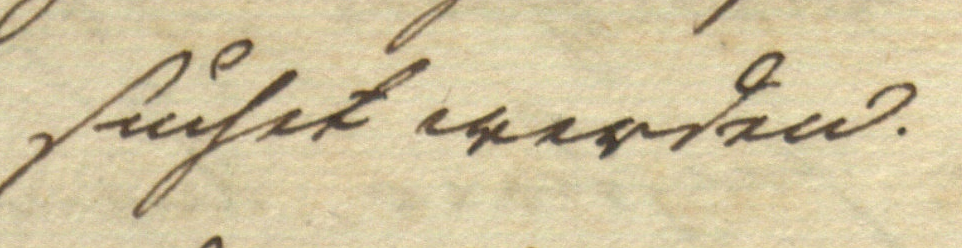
suchet werden.
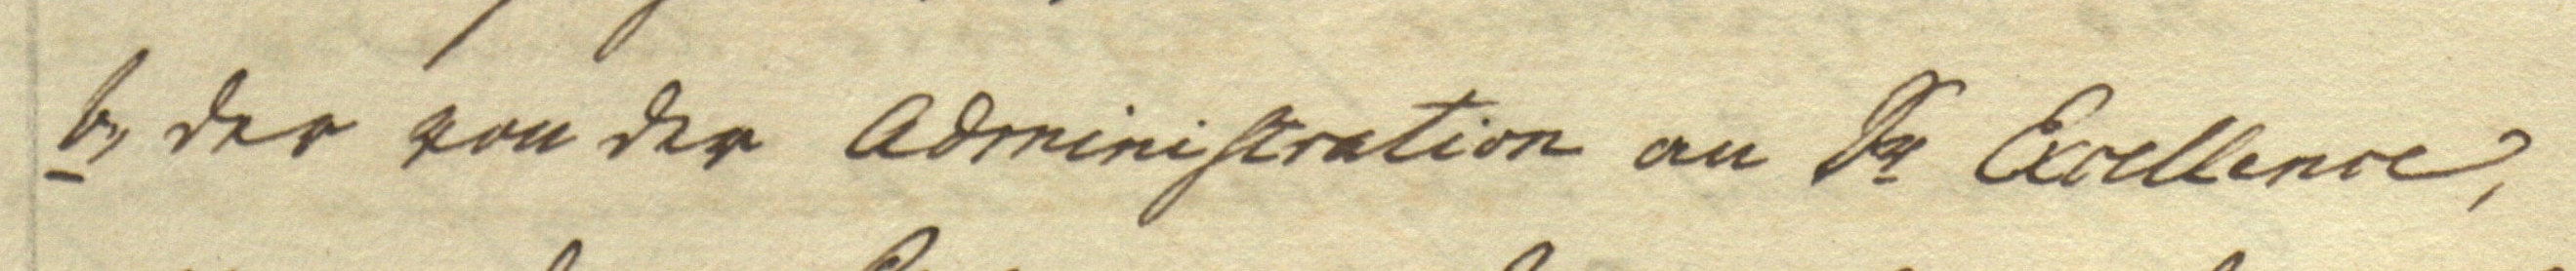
b., der von der Administration an Sr Excellence,
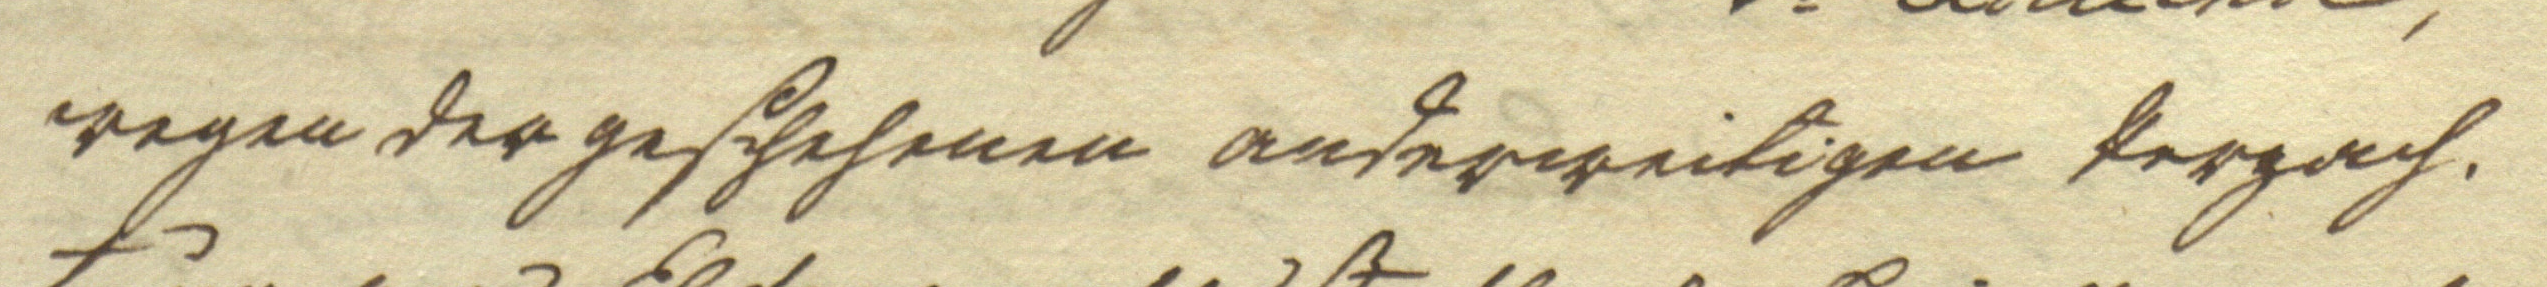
wegen der geschehenen anderweitigen Verpach¬
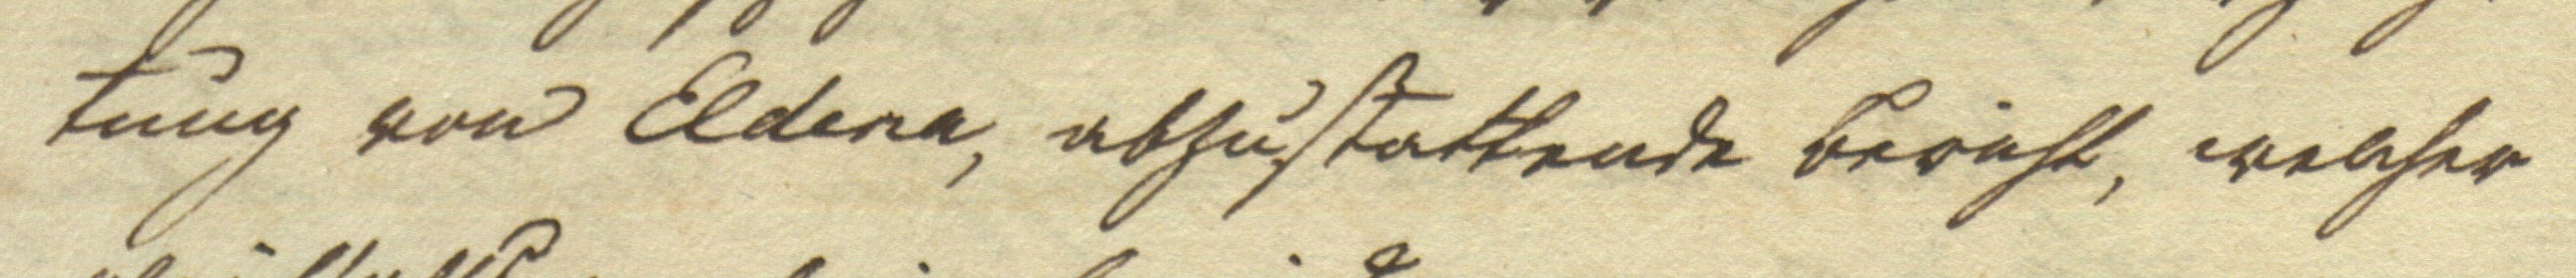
tung von Eldena, abzustattende Bericht, welcher
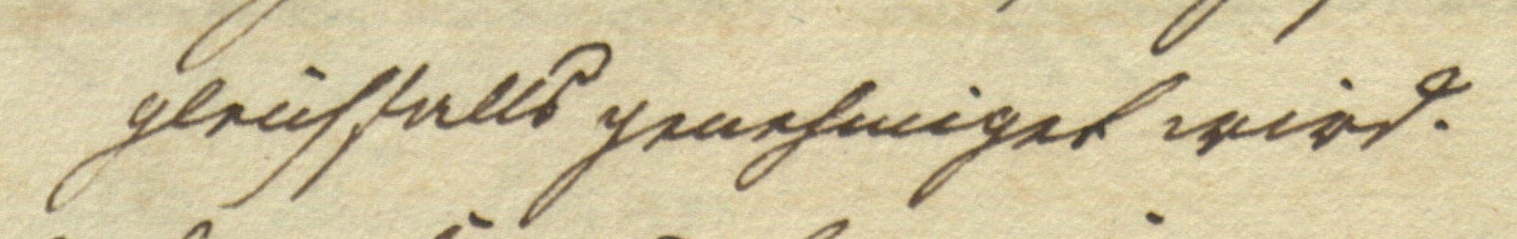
gleichfalls genehmiget wird.
